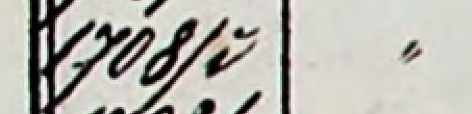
1708/c „
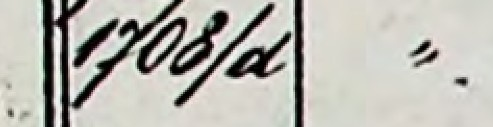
1708/d „
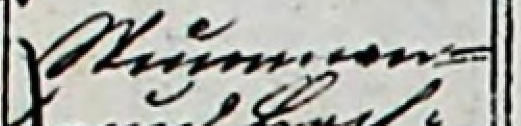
Stummen=
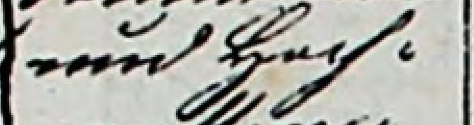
und Hoch„
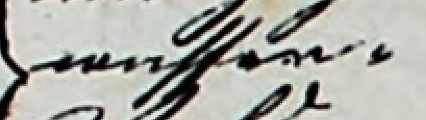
wasser„
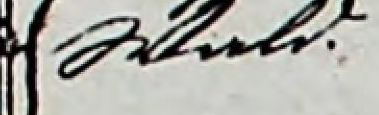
Wald.
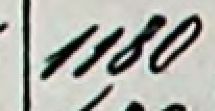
1180
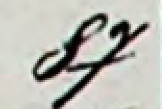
87
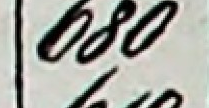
680
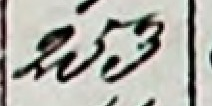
253
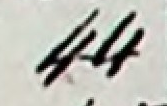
44
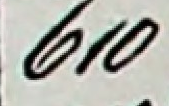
610
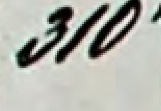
310
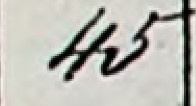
45
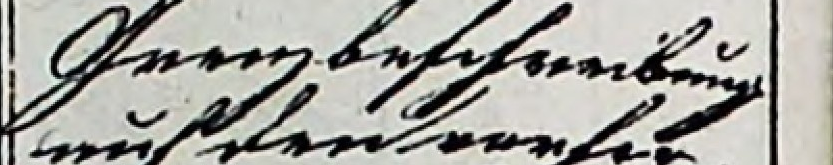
Grenzbeschreibung
